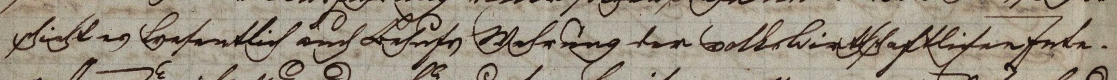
schieht es wesentlich auch Behufs Wahrung der volkswirthschaftlichen Inte-
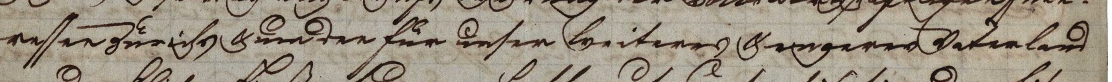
ressen Zürichs & um den für unser weiteres & engeres Vaterland
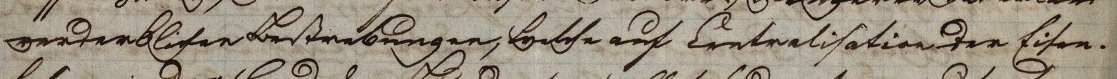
verderblichen Bestrebungen, welche auf Centralisation der Eisen-
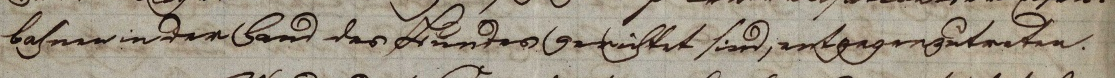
bahnen in der Hand des Bundes gerichtet sind, entgegenzutreten.
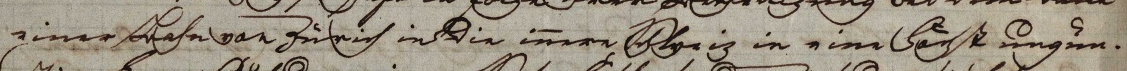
einer Bahn von Zürich in die innere Schweiz in eine höchst ungün-
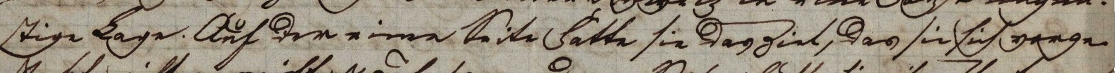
stige Lage. Auf der einen Seite hätte sie das Ziel, das sie sich vorge-
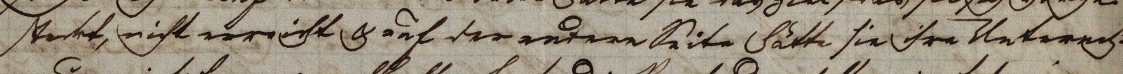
steckt, nicht erreicht & auf der andern Seite hätte sie ihre Unterneh-
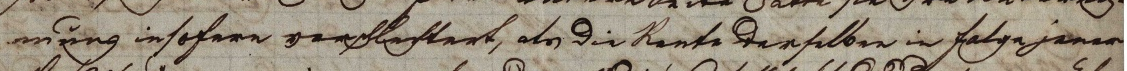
mung insofern verschlechtert, als die Rente derselben in Folge jener
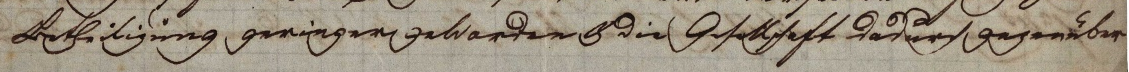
Betheiligung geringer geworden & die Gesellschaft dadurch gegenüber
